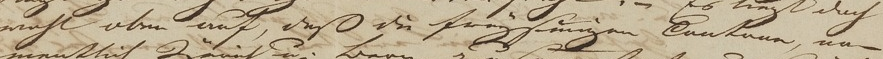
wohl oben auf, daß die freysinnigen Cantone, na-
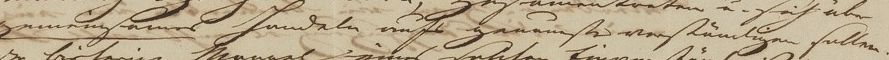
gemeinsames Handeln aufs genaueste verständigen sollen.
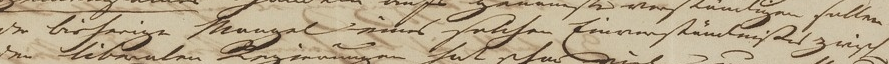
Der bisherige Mangel eines solchen Einverständnißes zwischen
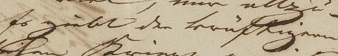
Es giebt der kräftigern
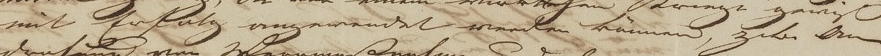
mit Erfolg angewendet werden können, z. B. An-
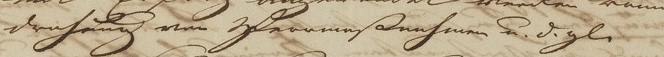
drohung von Sperrmaßnahmen u. d.gl.
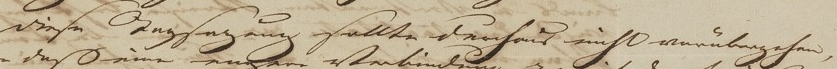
Diese Tagsazung sollte durchaus nicht vorübergehen,
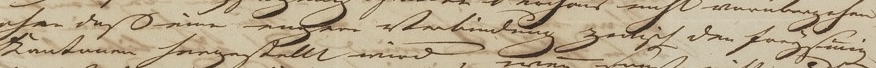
ohne daß eine engere Verbindung zwischen den freysinnigen
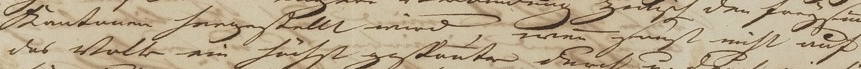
Kantonen hergestellt wird, wenn sonst nicht auf
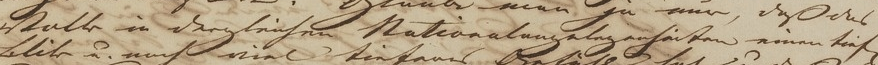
Volk in dergleichen Nationalangelegenheiten einen tiefen
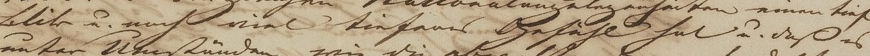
Blik u. noch viel tieferes Gefühl hat u. daß es
